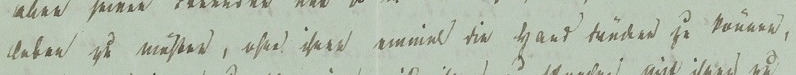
leben zu müssen, ohne ihnen einmal die Hand drücken zu können,
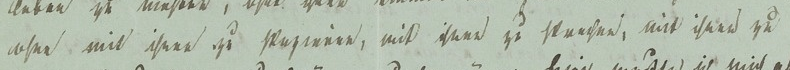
ohne mit ihnen zu spazieren, mit ihnen zu sprechen, mit ihnen zu
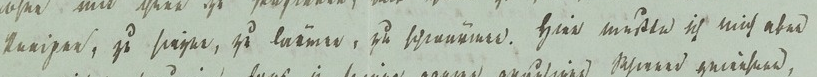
kneipen, zu singen, zu lärmen, zu schwärmen. Hier mußte ich mich aber
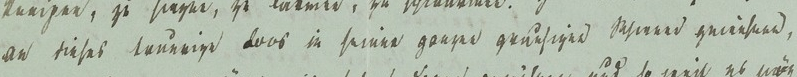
an dieses traurige Loos in seiner ganzen grausigen Schwere gewöhnen,
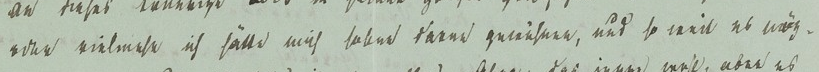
oder vielmehr ich hätte mich sollen daran gewöhnen, und so viel es mög-
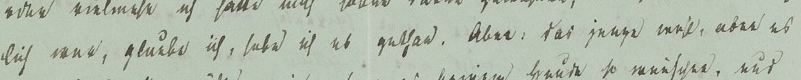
lich war, glaube ich, habe ich es gethan. Aber: das jenge wohl, aber es
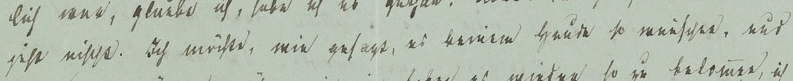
jeht nischt. Ich möchte, wie gesagt, es keinem Hunde so wünschen, und
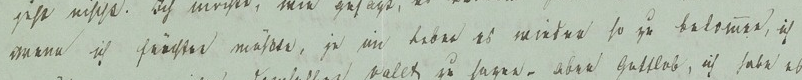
wenn ich fürchten müßte, je im Leben es wieder so zu bekommen, ich
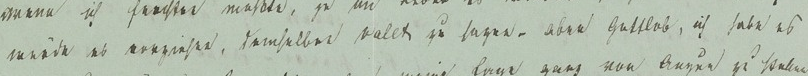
würde es vorziehen, demselben valet zu sagen – aber Gottlob, ich habe es
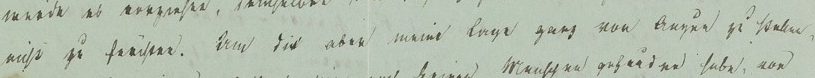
nicht zu fürchten. Um dir aber meine Lage ganz vor Augen zu stellen,
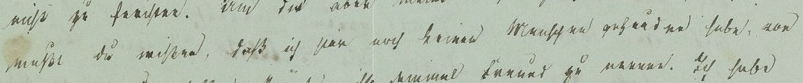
mußt du wißen, daß ich hier noch keinen Menschen gefunden habe, von
